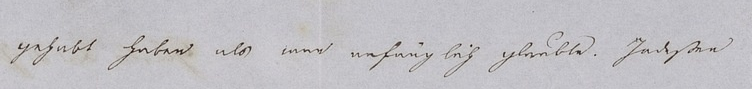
gehabt haben als man anfänglich glaubte. Indessen
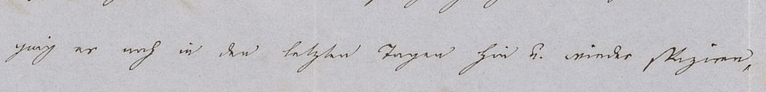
ging er noch in den letzten Tagen hin u. wieder spaziren,
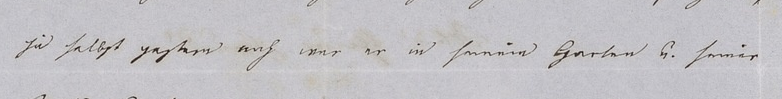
ja selbst gestern noch war er in seinem Garten u. seiner
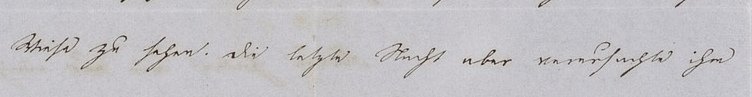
Wiese zu sehen. Die letzte Nacht aber verursachte ihm
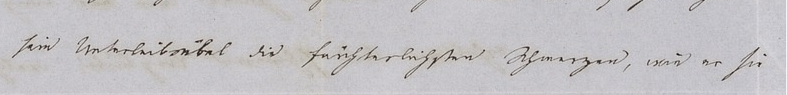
sein Unterleibsübel die fürcherlichsten Schmerzen, wie er sie
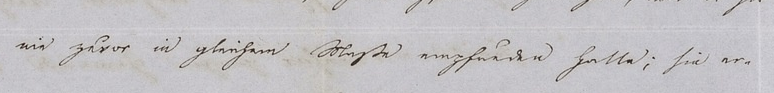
nie zuvor in gleichem Maße empfunden hatte; sie er-
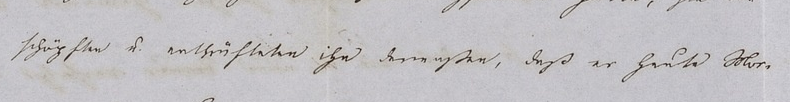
schöpften u. entkräfteten ihn dermaßen, daß er heute Mor-
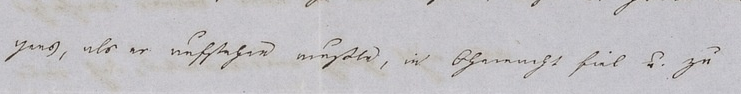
gens, als er aufstehen mußte, in Ohnmacht fiel u. zu
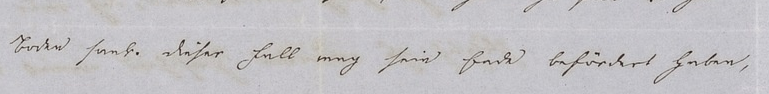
Boden sank. Dieser Fall mag sein Ende befördert haben,
